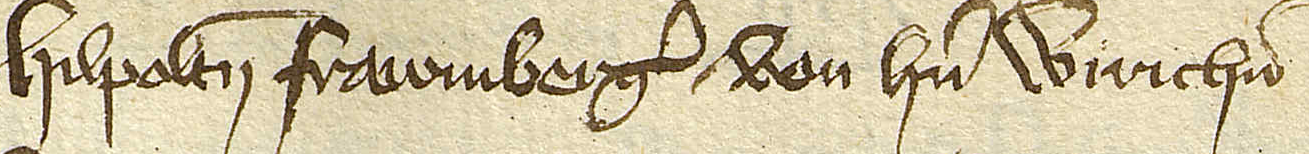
Hilpoltn* frawmberg* / von hn* wirichn*
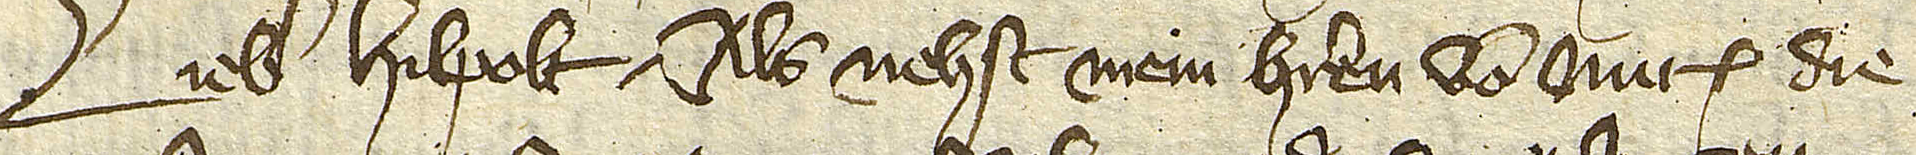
Lieb* Hilpolt / Als nehſt mein hr*en vo* Nur* die
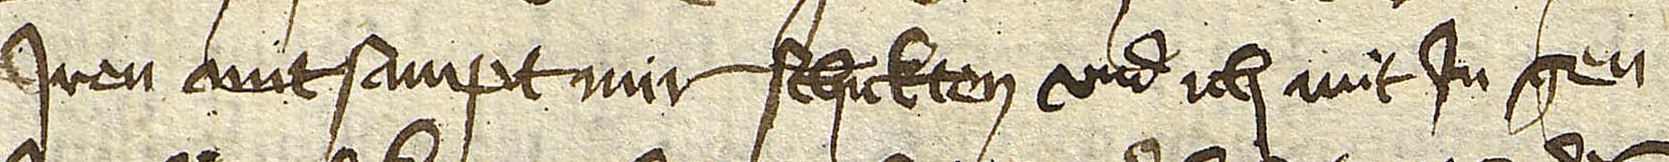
Iren mitſampt mir ſchicken vnd ich mit In gen
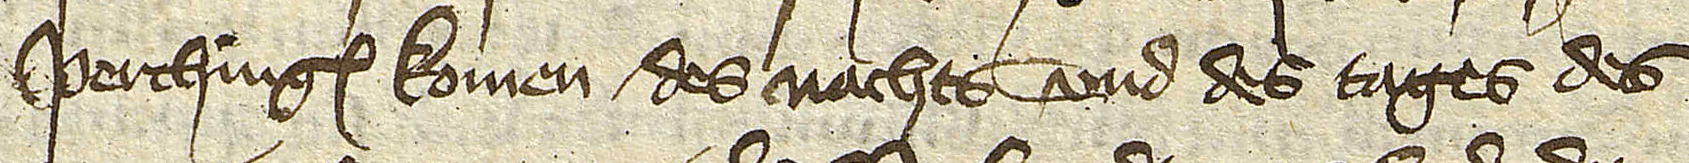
Perching* komen / des nachts vnd des tages des
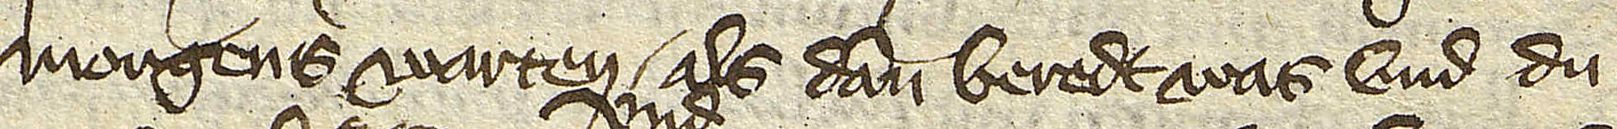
morgens warten / als dan* beredt was vnd du
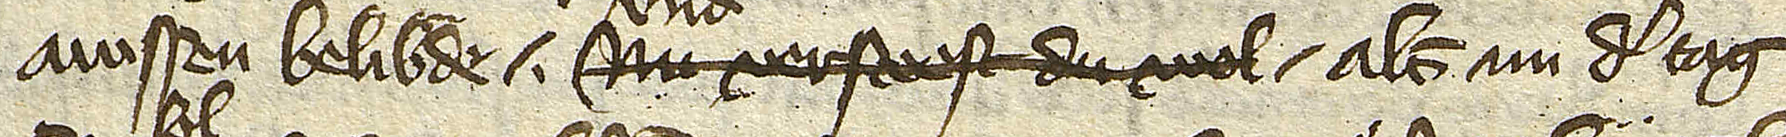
awſſen belibde / . Nu verſteeſt du wol / als nu d* tag
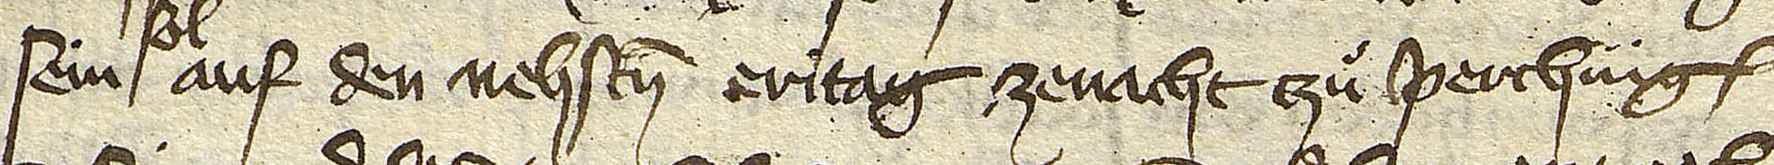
ſein auf den nehſtn* eritag cʒenacht cʒü Perching*
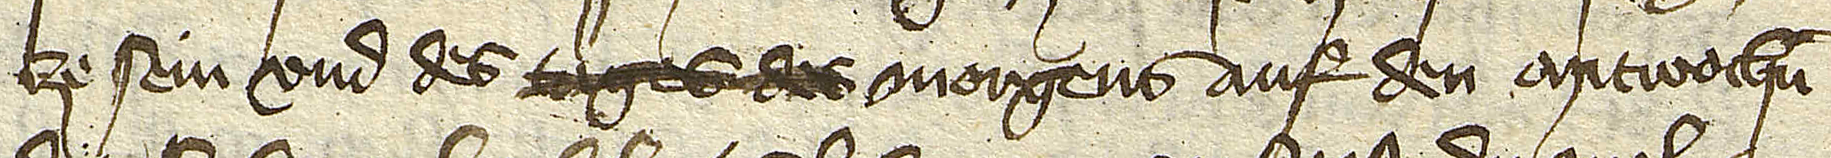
cʒe ſein vnd des tages des morgens auf den Mitwochn*
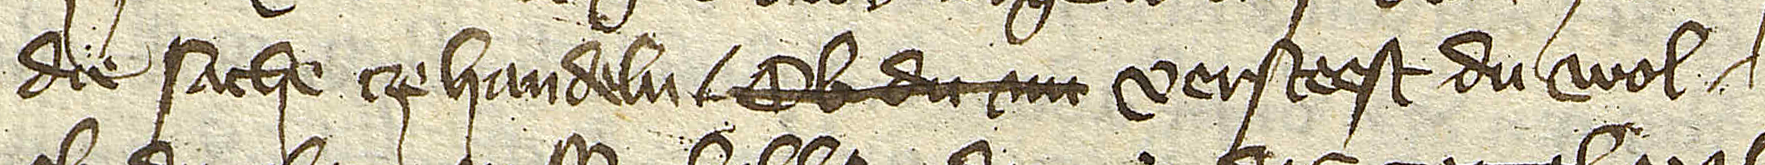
die ſache cʒe handeln / Ob du nu verſteeſt du wol /
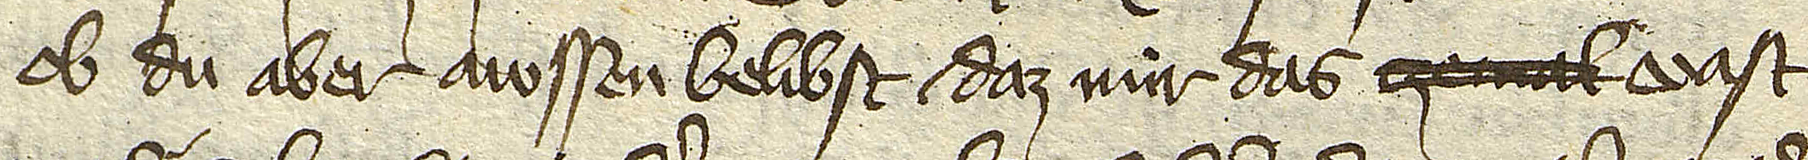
ob du aber awſſen belibſt / daʒ mir das cʒemal vaſt
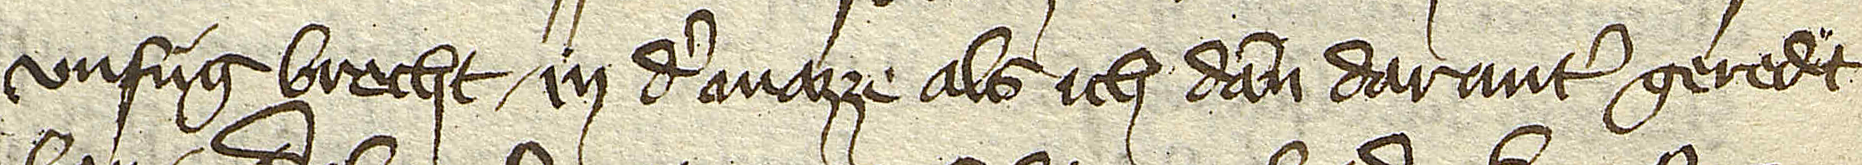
vnfüg brecht / in d* maʒʒe als ich dan* darunt* geredt
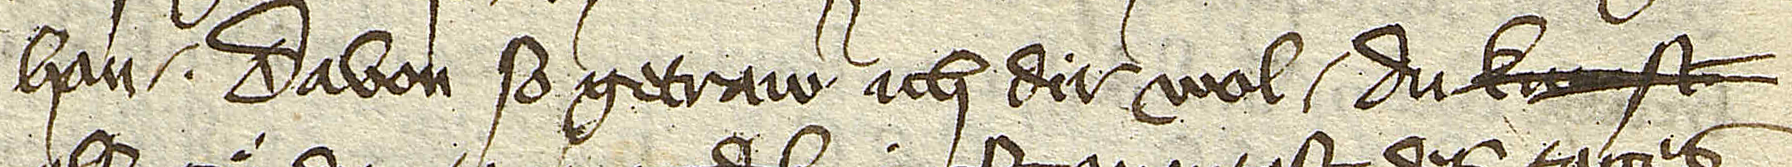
han / . Davon ſo getraw ich dir wol / du kumſt
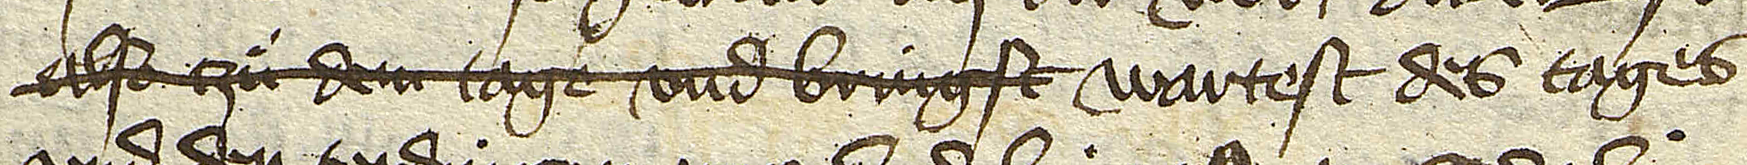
alſo cʒü dem tage vnd bringſt warteſt des tages
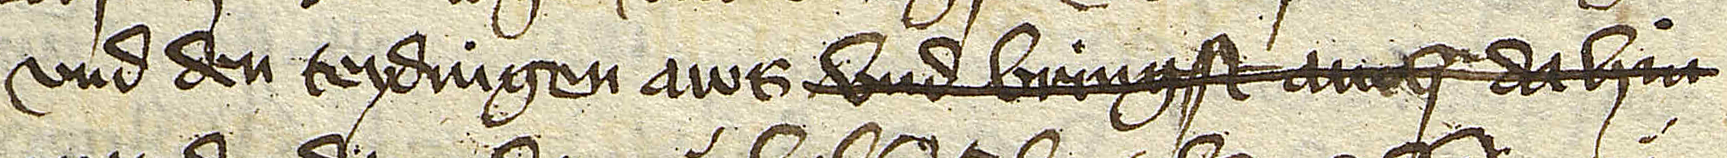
vnd den teydingen aws vnd bringſt awch da hin
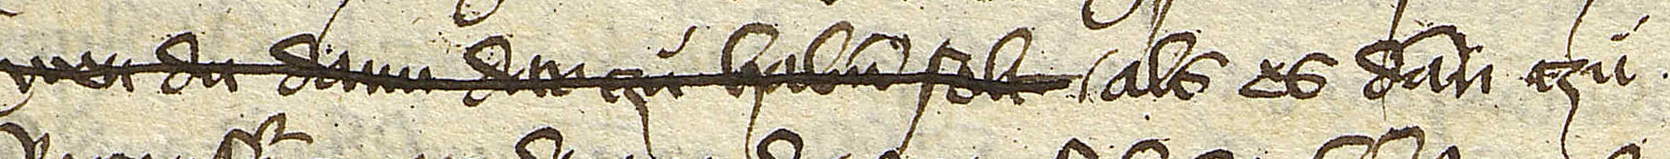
wen da dann dar cʒü habn* ſolt / als es dan* cʒü
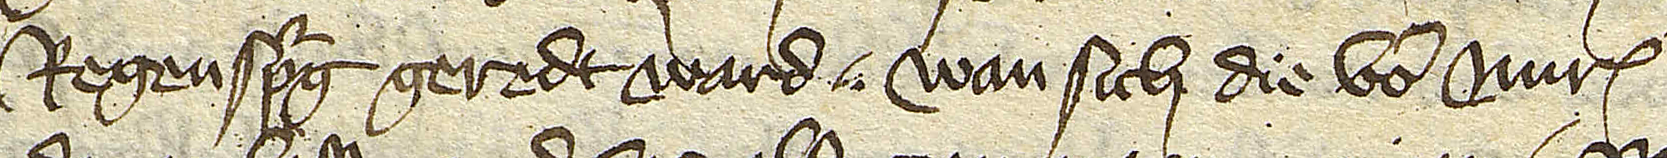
Regenſp*g geredt ward / . wan ſich die vo* Nur*
